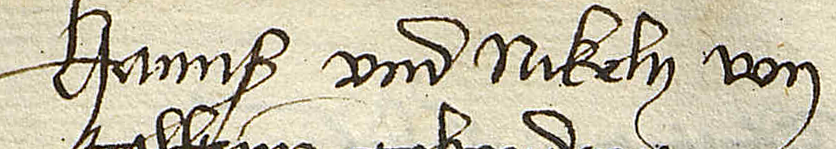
Hannſ* vnd Nikeln von
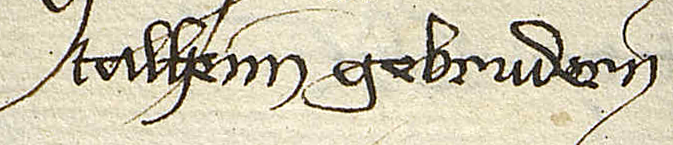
talheim gebrudern
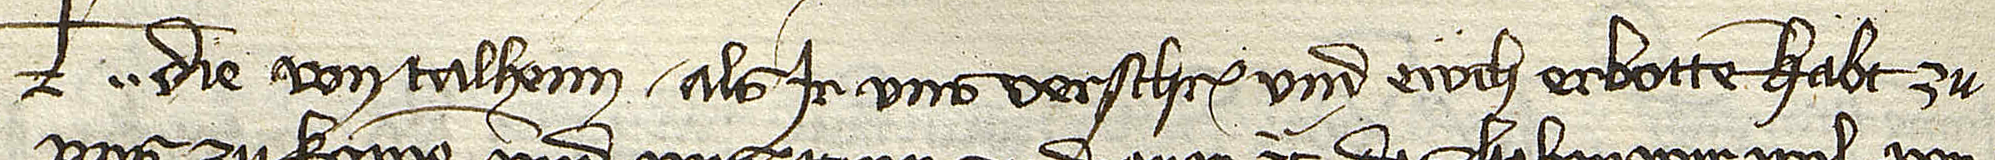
L* ~ die von talheim / als Ir vns verſchr* vnd eẅch erbotte* habt ʒu
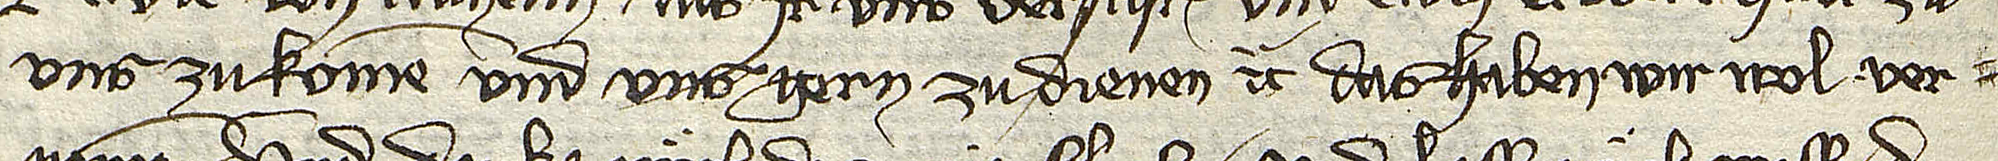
vns ʒu kome* vnd vns gern ʒu dienen ec* das haben wir wol . ver =
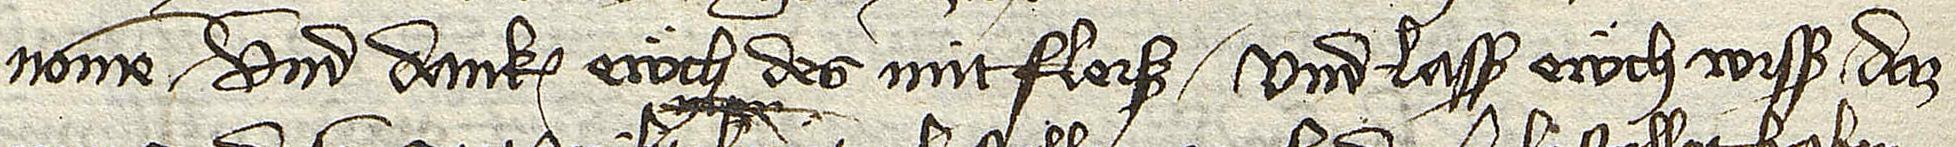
nome* / Vnd dank* eẅch des mit fleiſʒ / vnd laſſ* eẅch wiſſ* / daʒ
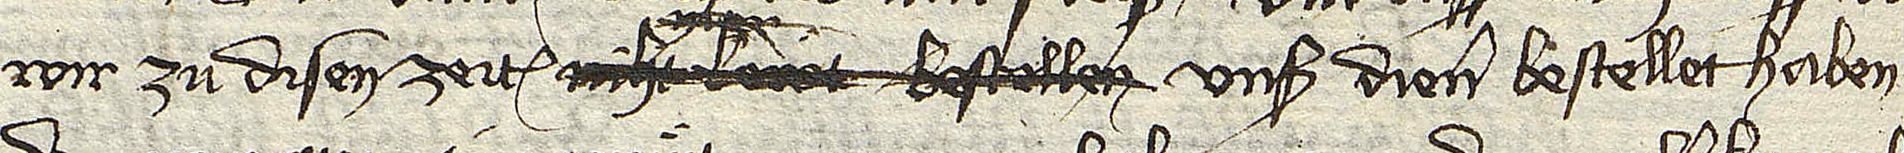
wir ʒu diſen ʒeit* niht lewt beſtellen vnſ* dien* beſtellet haben
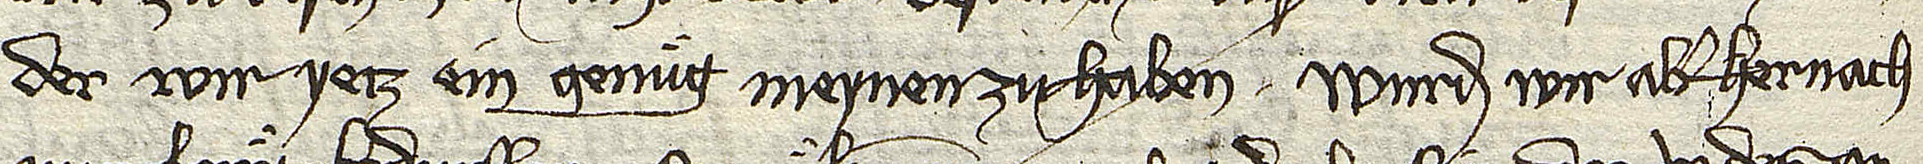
der wir yecʒ ein genüg meynen ʒu haben / Wurd* wir ab* hernach
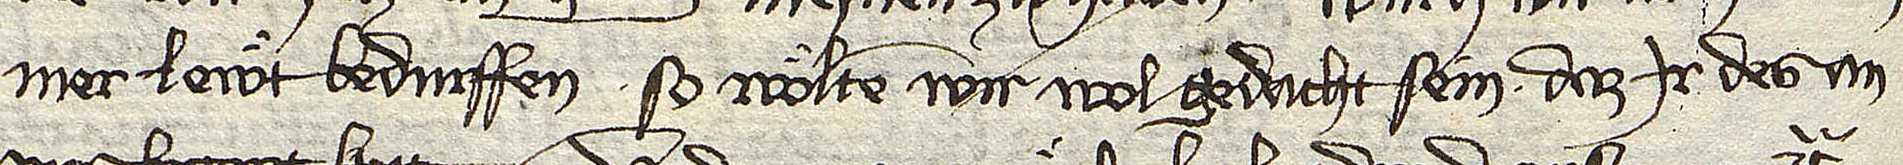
mer leẅt bedurffen . ſo wölte* wir wol gedacht ſein . daʒ Ir des an
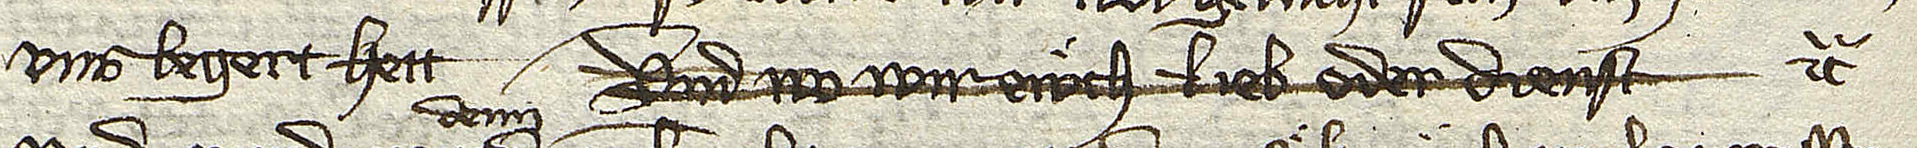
vns begert hett / Vnd wo wir eẅch lieb oder dienſt ec*
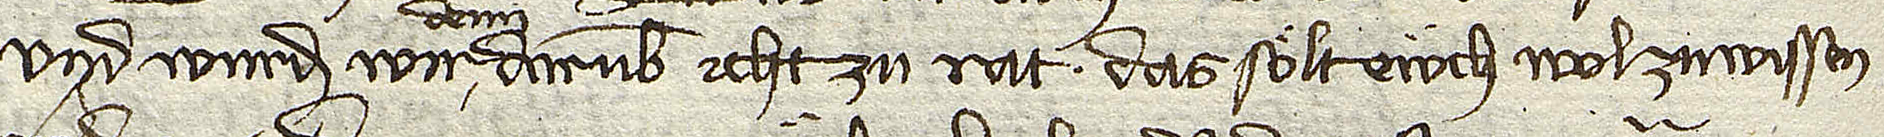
vnd wurd* wir darub* icht ʒu rat . das ſölt eẅch wol ʒuwiſſen
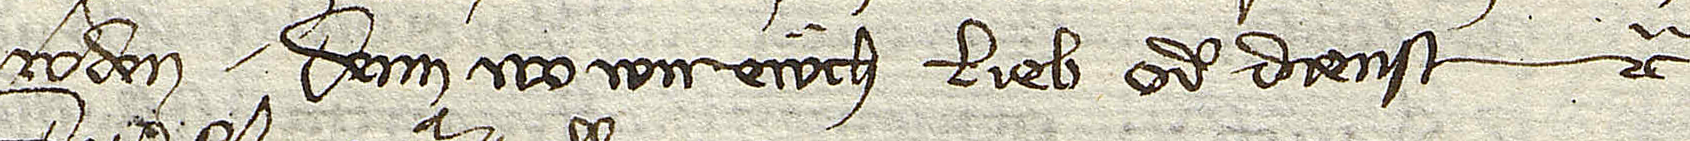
w*den / Denn wo wir eẅch lieb od* dienſt ec*
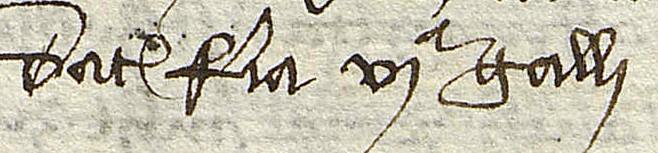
Dat* fia* vi* galli
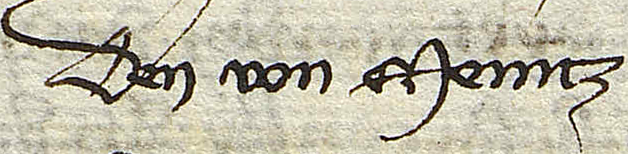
Den von Meincʒ
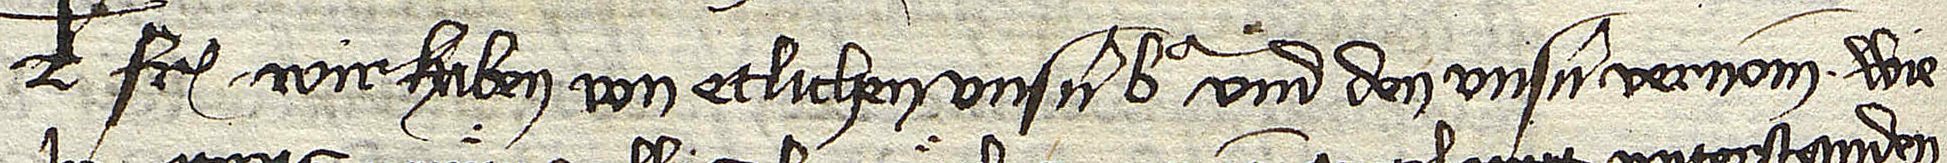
L* fr* / wir haben von etlichen vnſ*n b* vnd den vnſ*n vernom* . wie
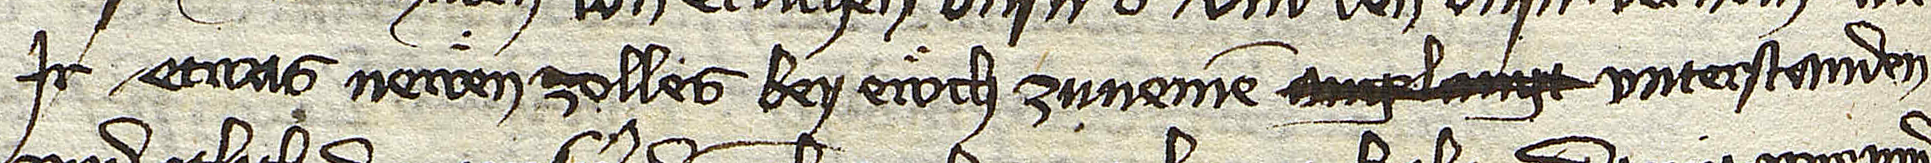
Ir / etwas neẅen ʒolles bey eẅch ʒuneme* angelangt vnterſtanden
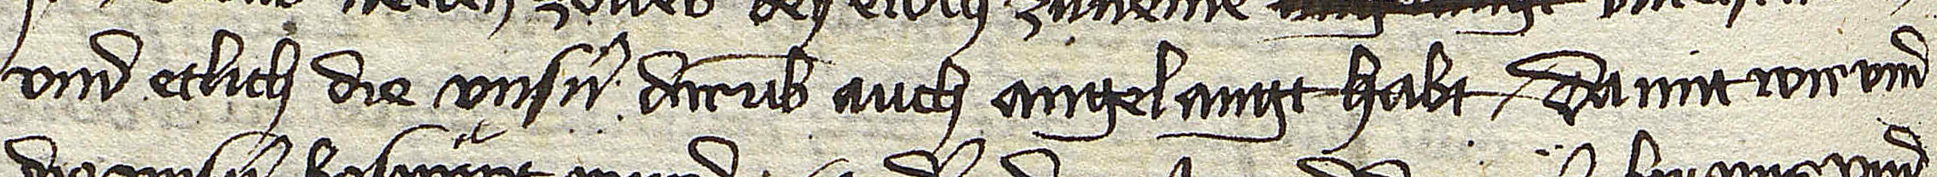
vnd etlich die vnſ*n darub* auch angelangt habt / Damit wir vnd
